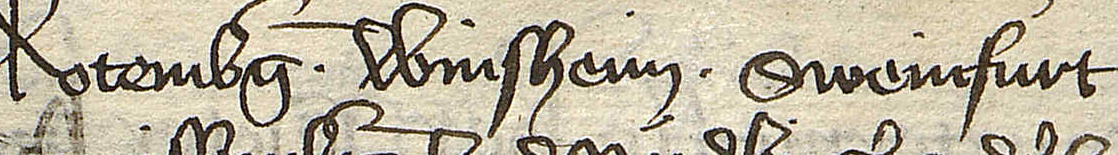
Rotembg* . Winſheim . Sweinfürt
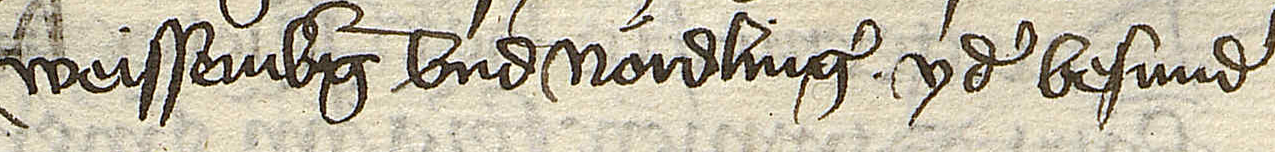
weiſſemb*g vnd Nördling* . yd* beſund*
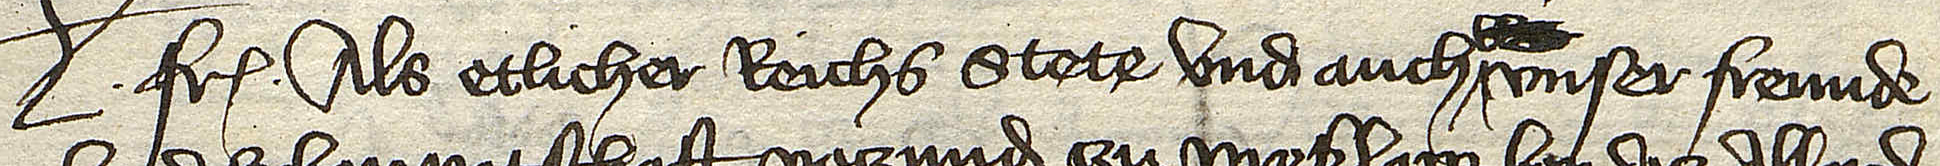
L* . fr* . Als etlicher Reichs Stete vnd auch vnſer freunde
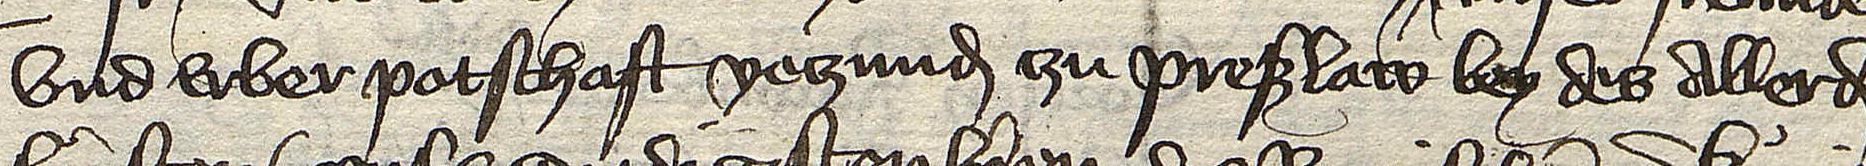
vnd Erber potſchaft yecʒund* cʒu Preſʒlaw bey des Allerd*
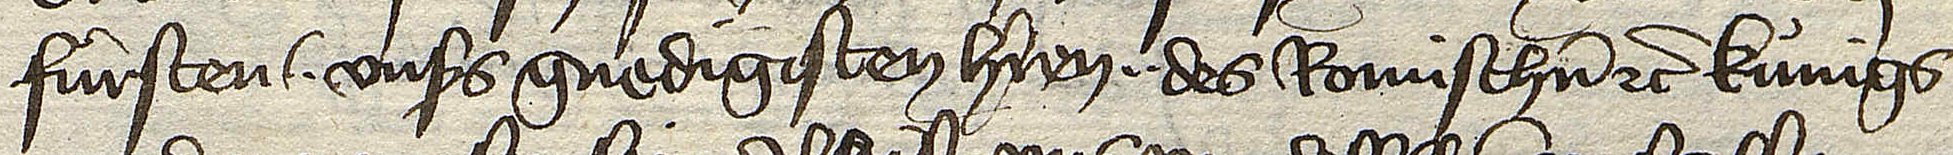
fürſten / . vnſ*s gnedigiſten h*ren ~ des Romiſchn* ec* künigs
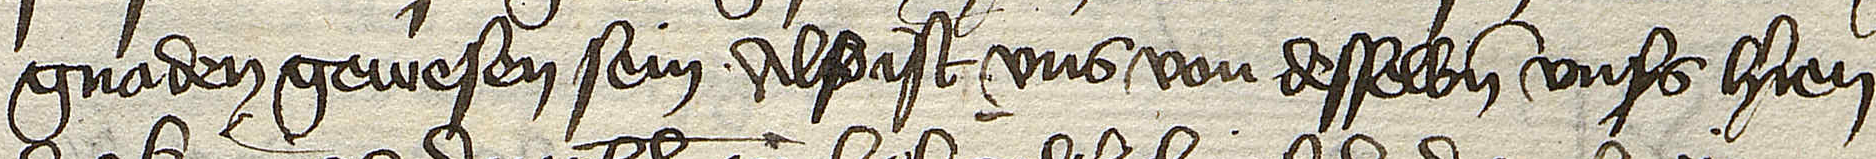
gnaden geweſen ſein . Alſo iſt vns von deſſelbn* vnſ*s h*ren
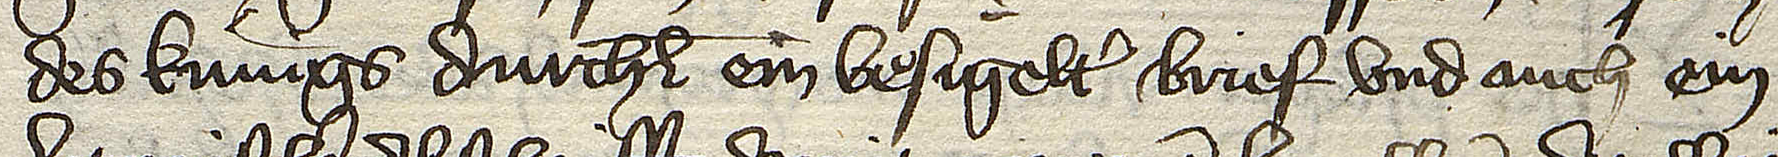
des künigs durchl* ein beſigelt* / brief vnd auch ein
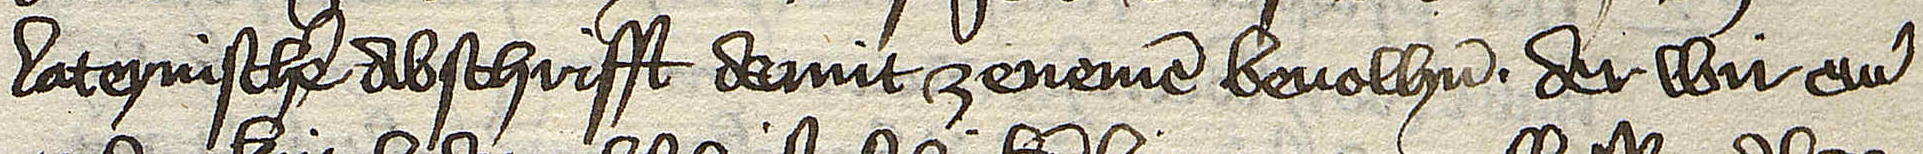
lateyniſche* Abſchrifft damit cʒeneme* beuolhn* . der wir ew*
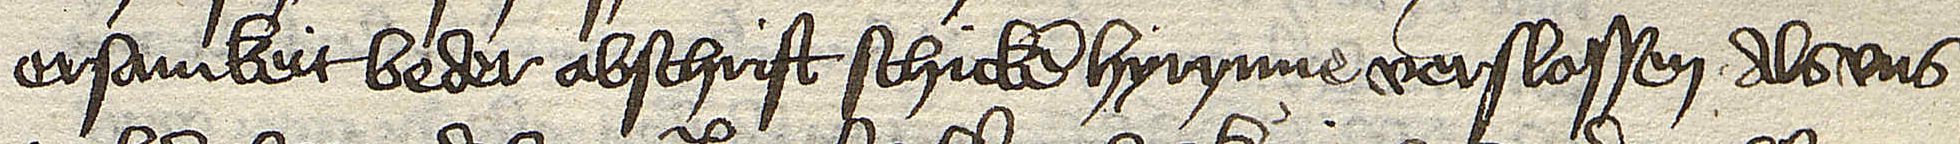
erſamkeit beder abſchrift ſchicke* hyrynne verſloſſen . Als vns
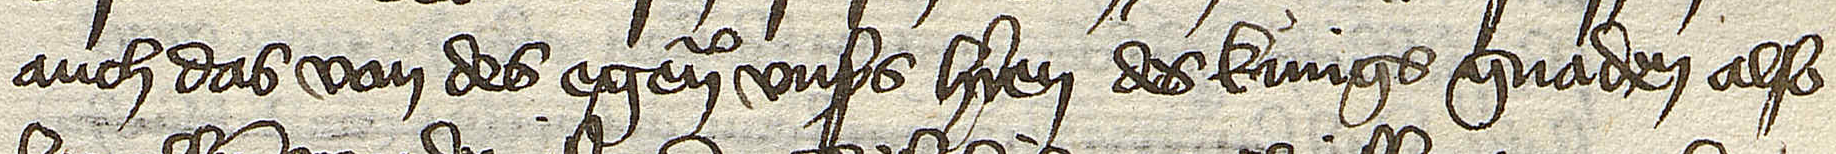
auch das von des egen* vnſ*s h*ren des künigs gnaden alſo
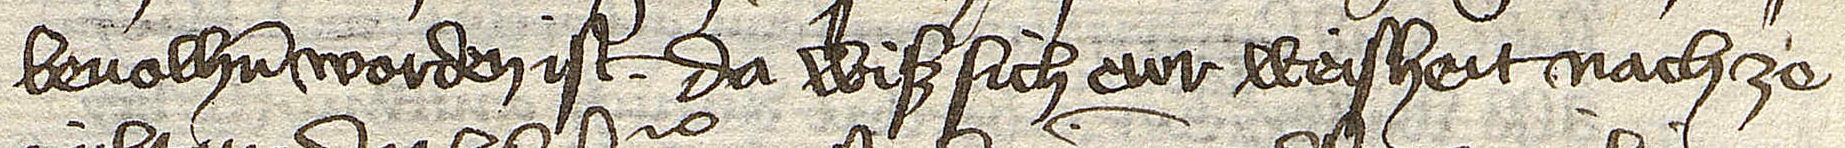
beuolhn* worden iſt . da wiſʒ ſich ewr weiſheit nach ʒe
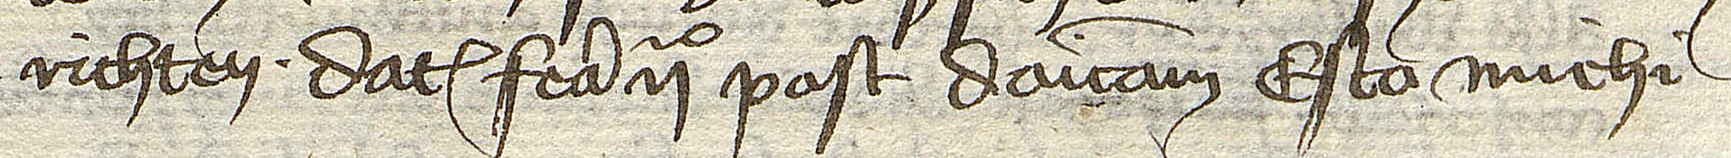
richten . Dat* fea* ii* poſt doicam* Eſto michi
